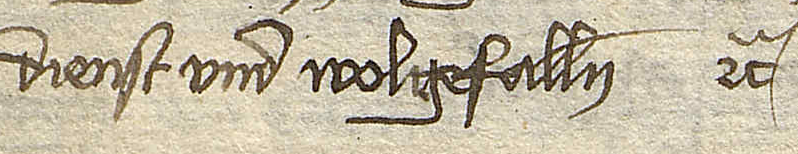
dienſt vnd wolgefalln* ec*
